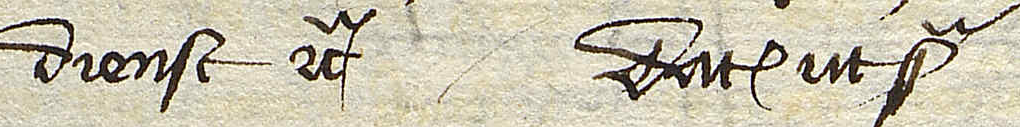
dienſt ec* / Dat* ut* ſ*
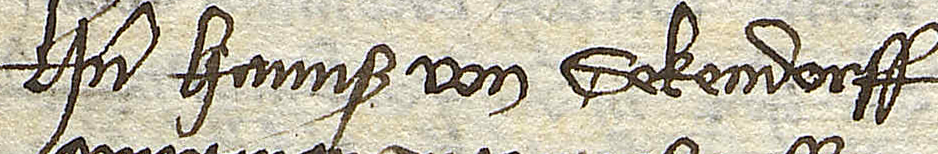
Hn* hannſ* von Sekendorff
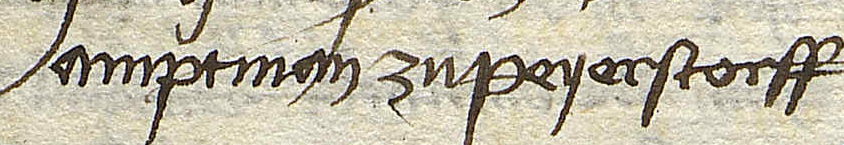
amptman ʒu Peyerſtorff
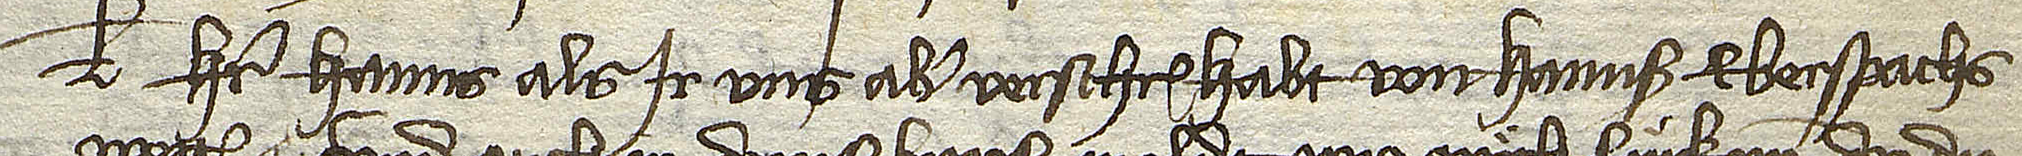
L* Hr* hanns als Ir vns ab* verſchr* habt von hannſ* Eberſpachs
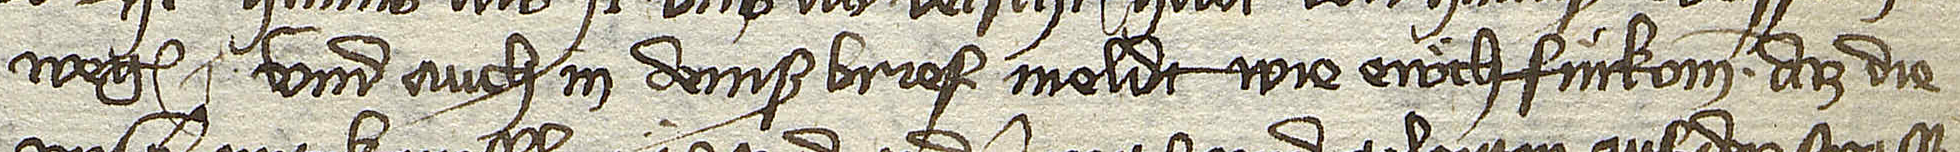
weg* / Vnd auch in demſ* brief meldt wie ewch fürkom* . daʒ die
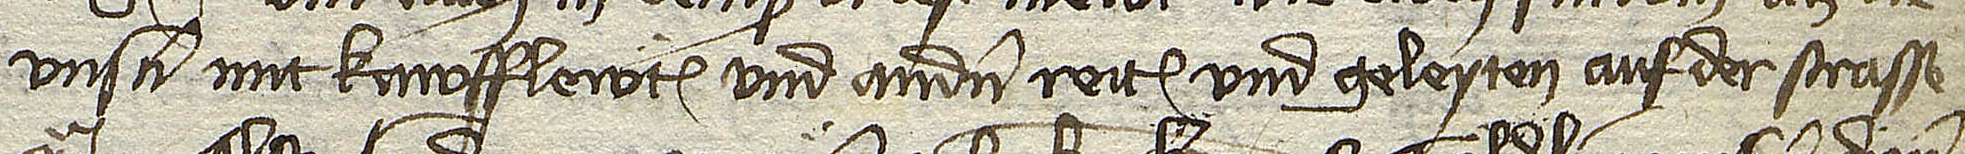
vnſ*n mit kawfflewt* vnd and*n reit* vnd geleyten auf der ſtraſſe
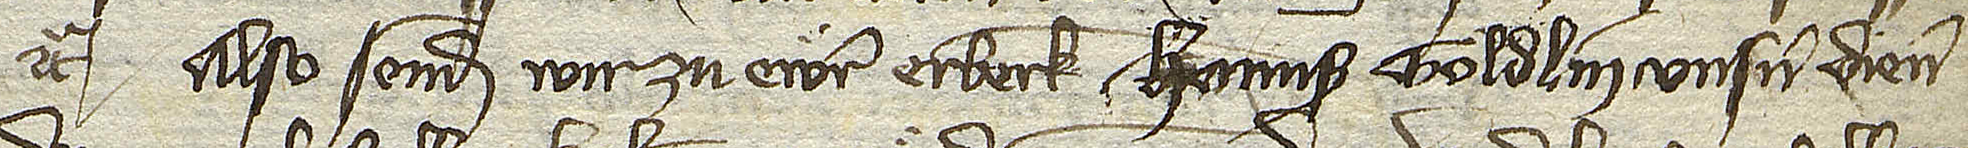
ec* Alſo ſend* wir ʒu ewr* erberk* / hannſ* Göldlin vnſ*n dien*
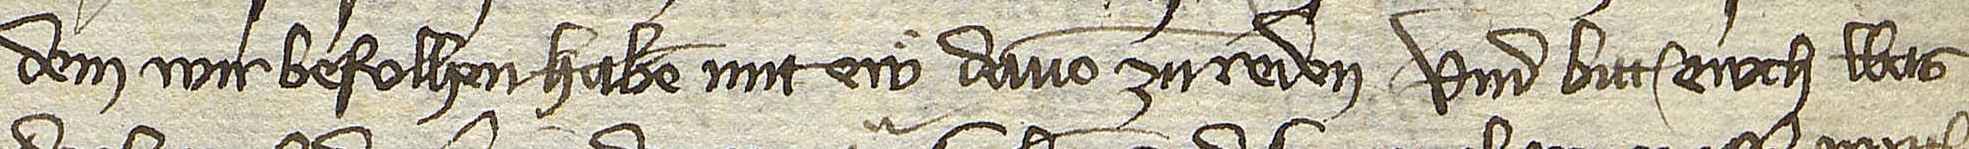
dem wir befolhen habe* mit ew dauo* ʒu reden / Vnd bitt* ewch was
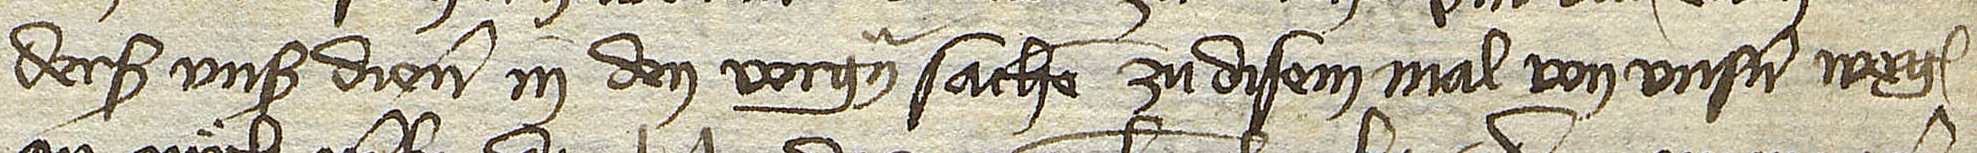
derſ* vnſ* dien* in den vorgn* ſache* ʒu diſem mal von vnſ*n weg*
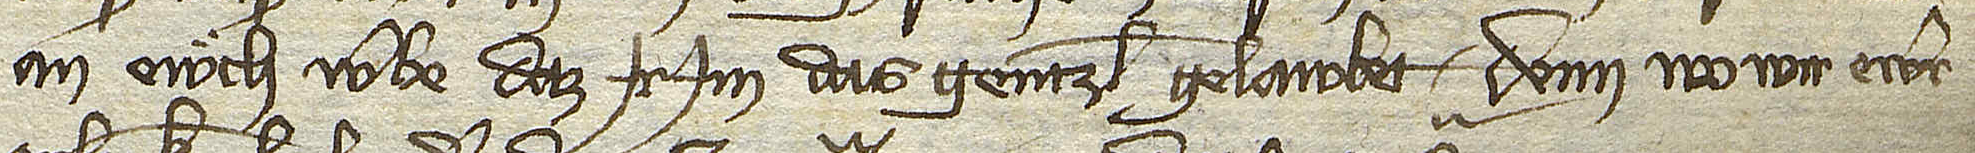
an ewch w*be daʒ Ir Im das gencʒl* gelawbet / Denn wo wir ewr*
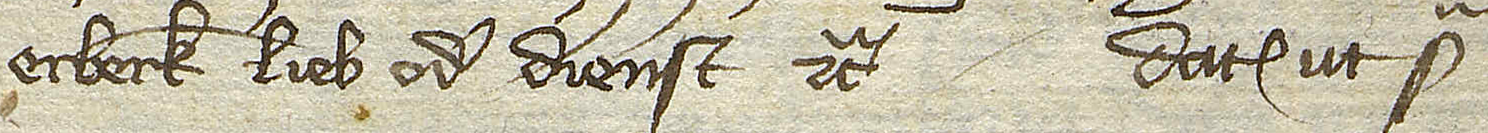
erberk* lieb od* dienſt ec* / Dat* ut ſ*
